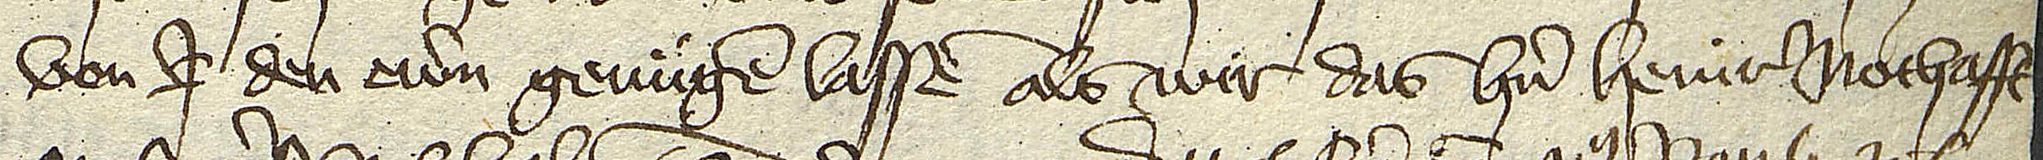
von I den ew*n genüge* laſſe* als wir das hn* heinr* Nothafft
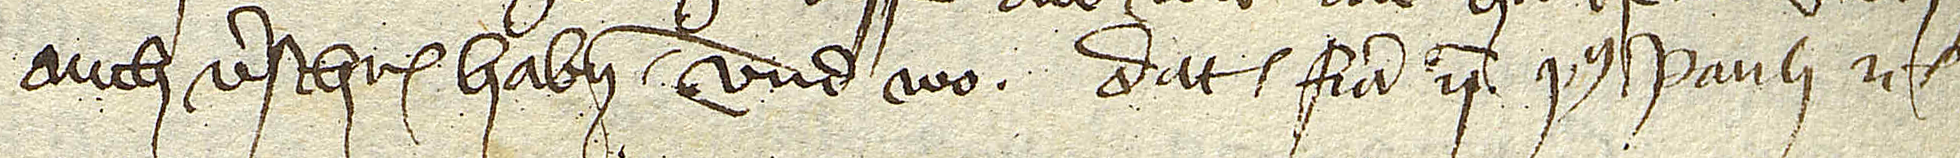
auch v*ſchr* habn* / vnd wo . Dat* fia* ii* p* Pauli ec*
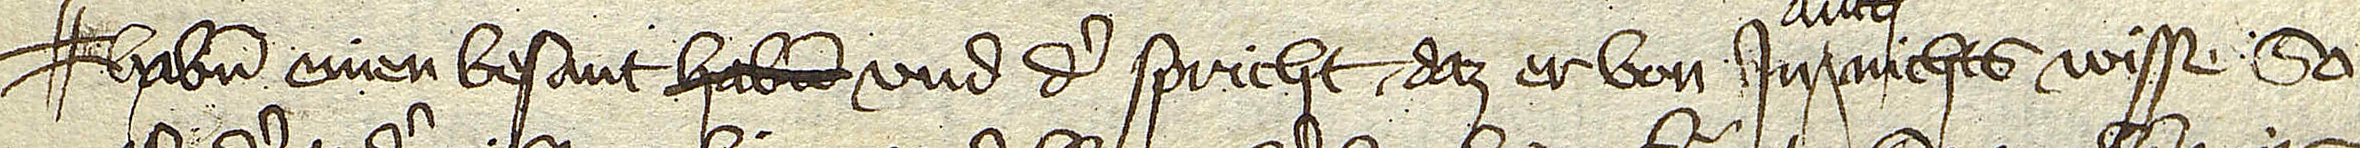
habn* einen beſant habn* vnd d* ſpricht / daʒ er von In nichts wiſſe So
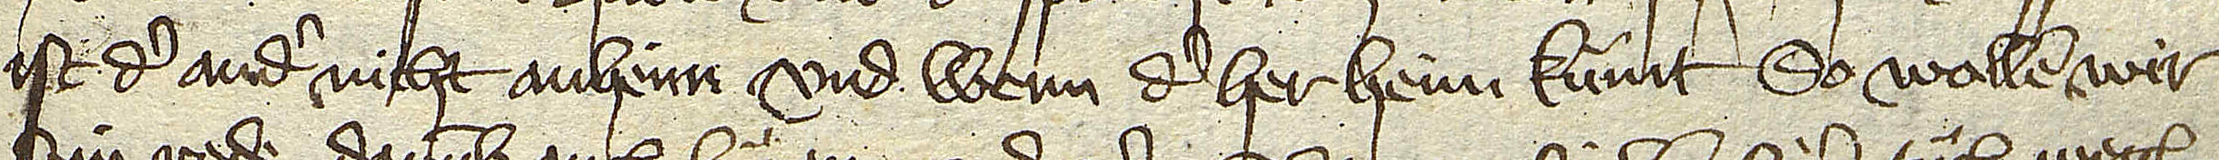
iſt d* and* nicht anheim / vnd wenn d* her heim kümt So wolle* wir
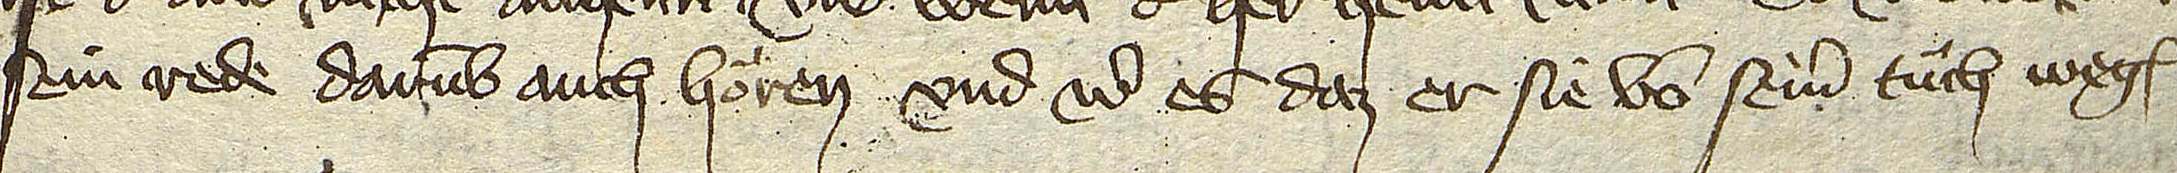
ſein rede darub* auch hören vnd w* es daʒ er ſie vo* ſein tüch weg*
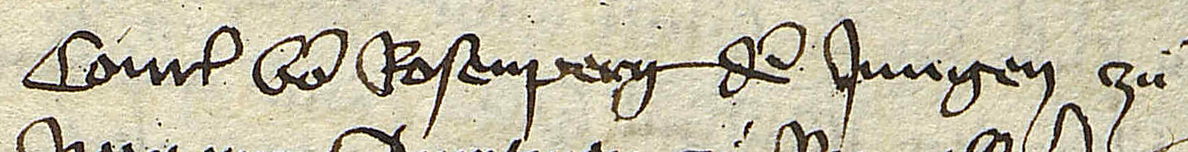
Conr* vo* Roſenperg d* Iungen cʒü
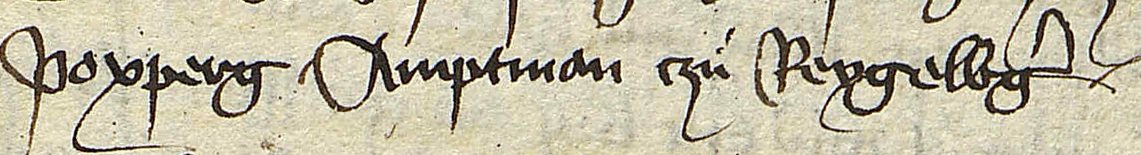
Poxperg / Amptman cʒü Reygelbg* /
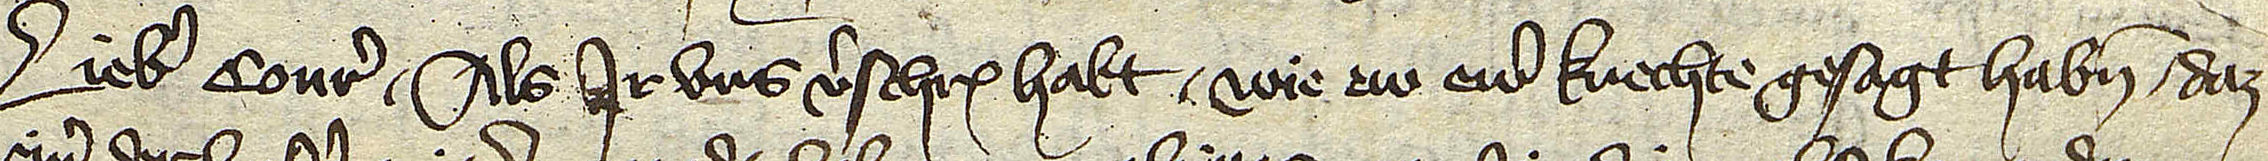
Lieb* Conr* / Als Ir vns v*ſchr* habt / wie ew ew* knechte geſagt habn* / daʒ
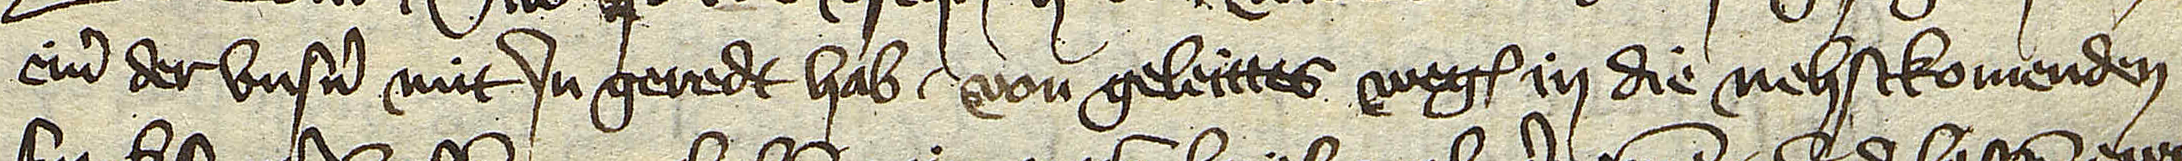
ein* der vnſn* mit In geredt hab / von geleittes weg* in die nehſtkomenden
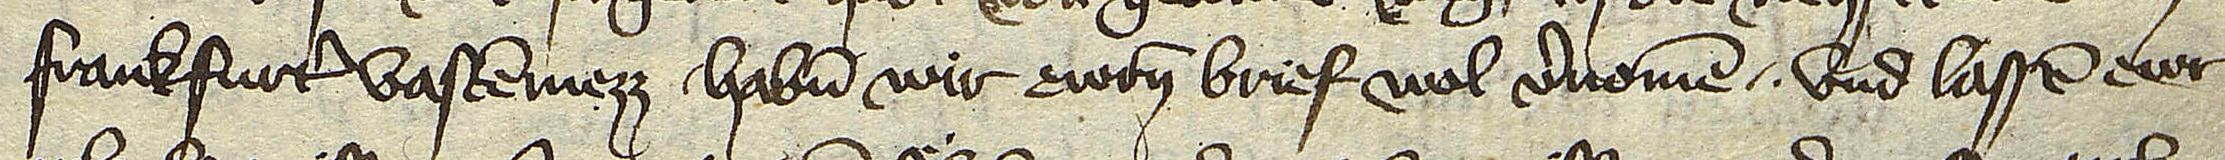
frankfurt* vaſte*meʒʒ / habn* wir ewrn* brief wol v*nome* / . vnd laſſe* ewr
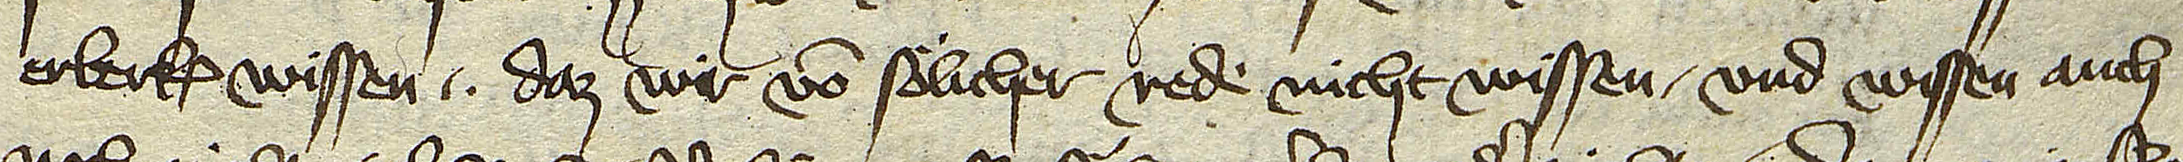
erberk* wiſſen / . daʒ wir vo* ſölicher rede nicht wiſſen / vnd wiſſen auch
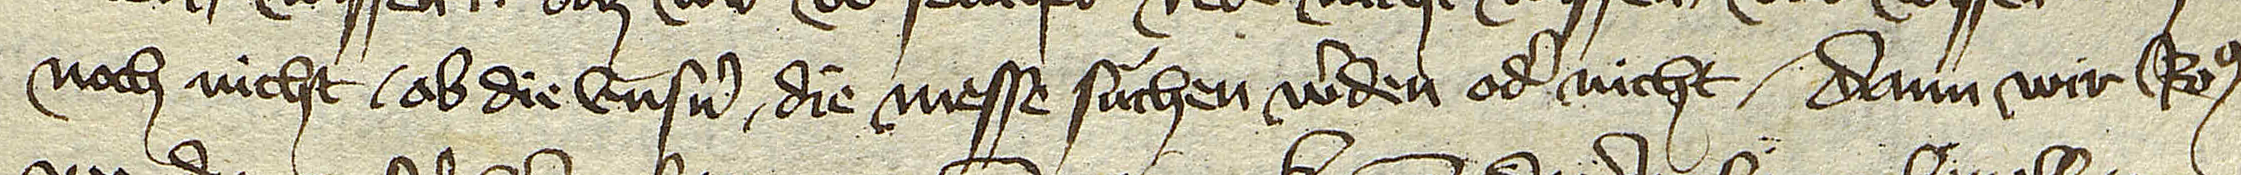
noch nicht / ob die vnſn* / die meſſe ſüchen w*den od* nicht / Dann wir Ro*
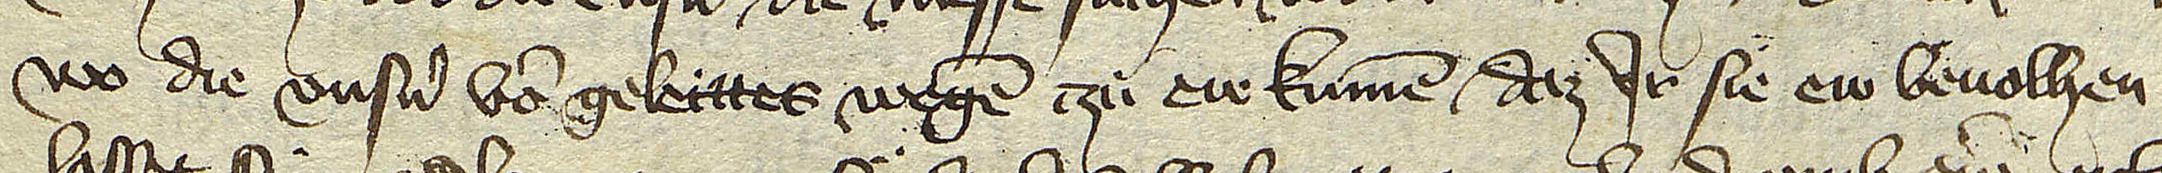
wo die vnſn* vo* geleittes wege* cʒü ew kume* / daʒ Ir ſie ew beuolhen
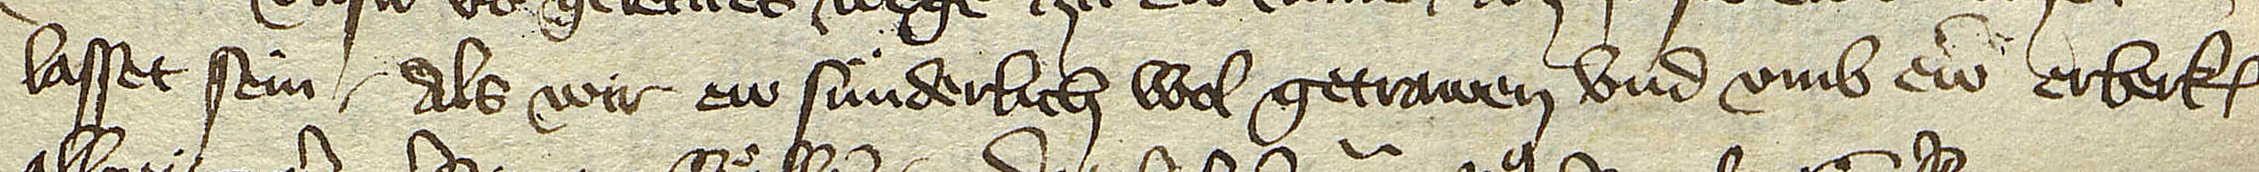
laſſet ſein / Als wir ew ſünderlich wol getrawen vnd vmb ew* erberk*
